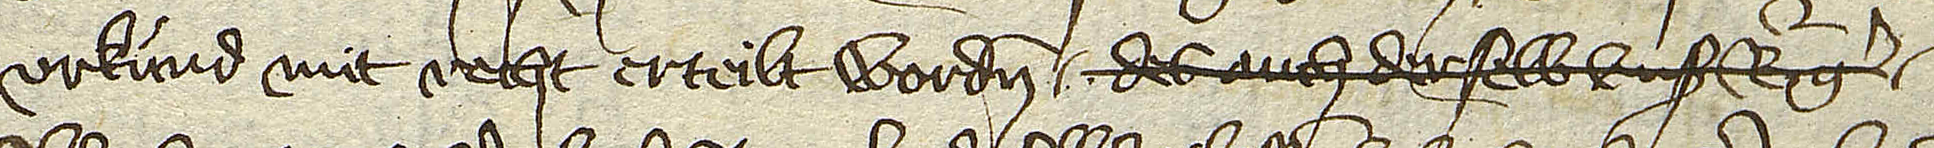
vrkünd mit recht erteilt wordn* / des auch derſelb vnſ* B*g* /
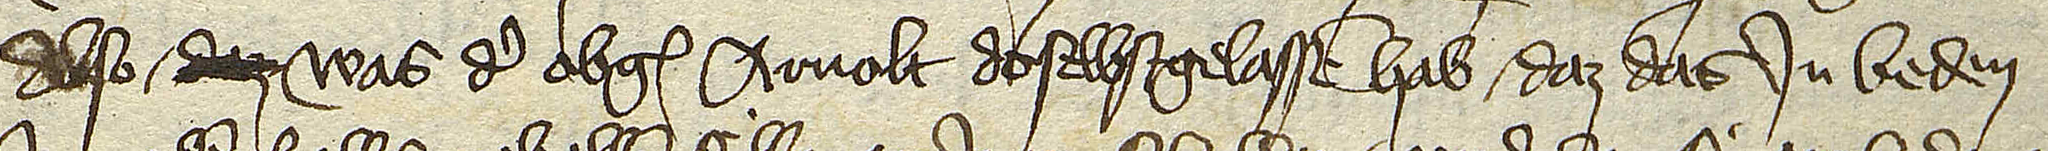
Alſo / daʒ was d* obg* Arnolt doſelbſt gelaſſe* hab / daʒ das In beden
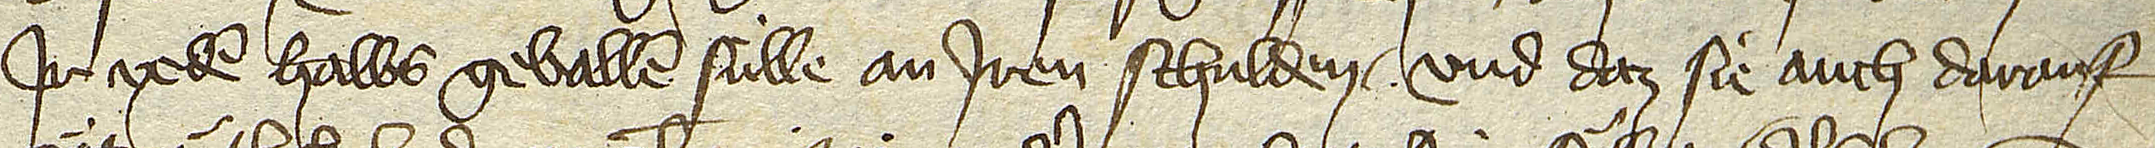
Ir yede* halbs gevalle* ſülle an Iren ſchulden / . vnd daʒ ſie auch darauf
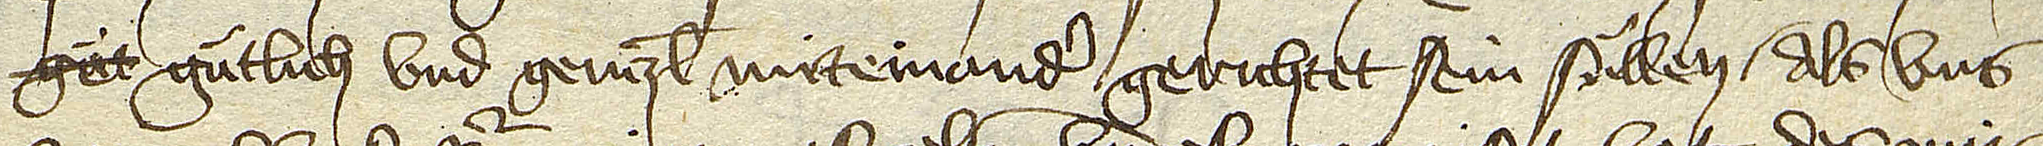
gët gütlich vnd gencʒl* miteinand* gerichtet ſein ſüllen / Als vns
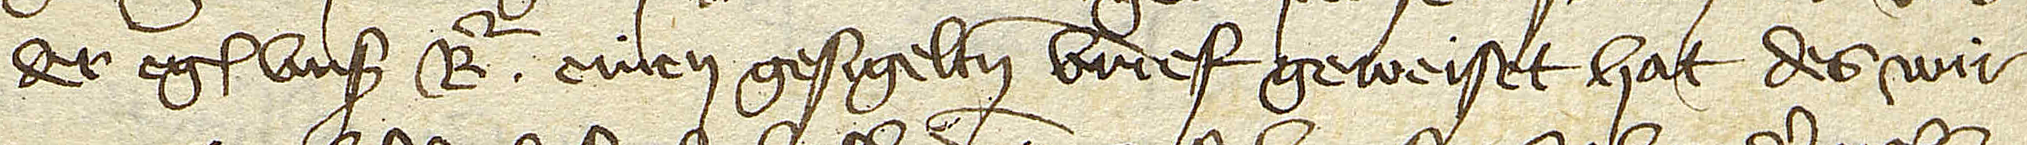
der eg* vnſ* B*. einen geſigeltn* brief geweiſet hat des wir
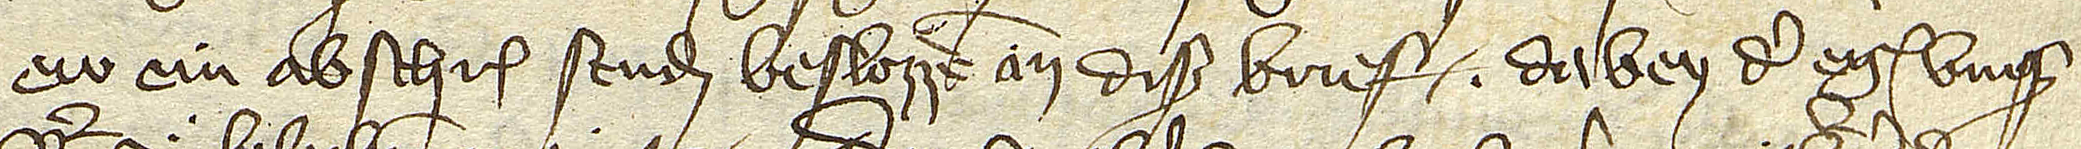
ew ein abſchr* ſend* beſloʒʒe* an diſʒ brief / . dabey d* eg* vnſ*
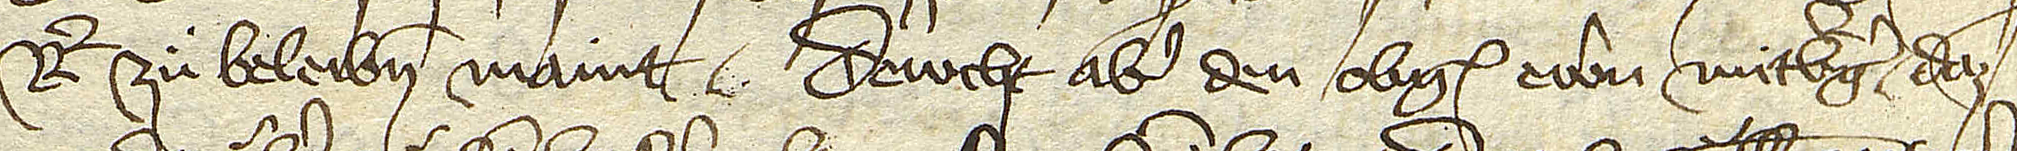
B* cʒü beleibn* maint / . Dewcht ab* den obg* ew*n mitb*g* / daʒ
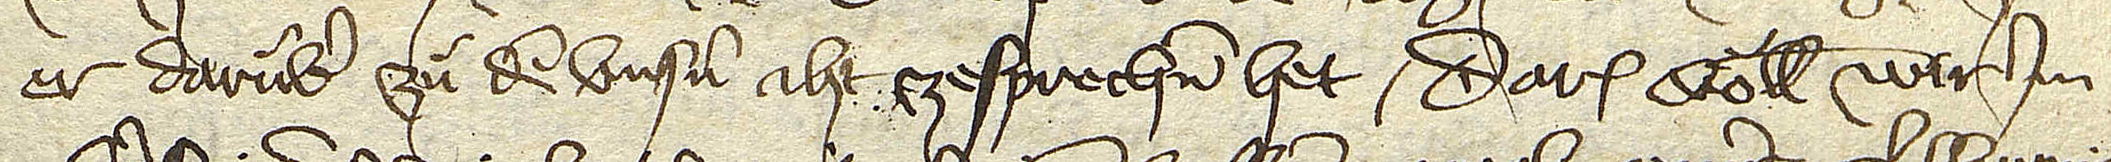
er darüb* cʒü d* vnſn* iht cʒeſprechn* het / Dar* wöll* wir Im
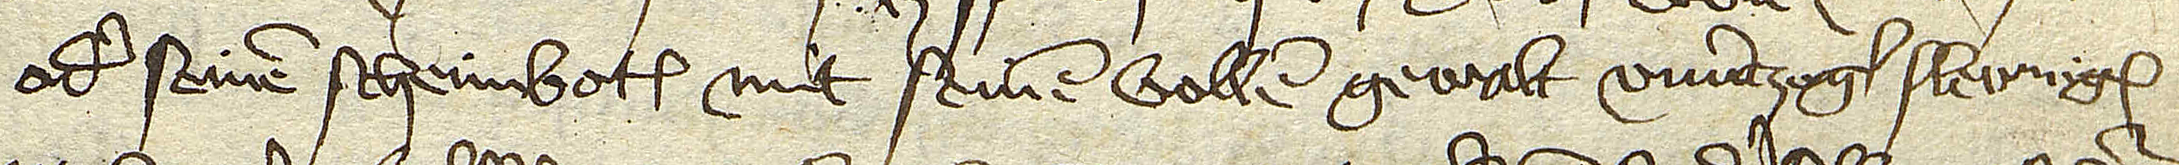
od* ſeine* ſcheimbot* mit ſeine* volle* gewalt vnu*cʒog* ſlewnig*
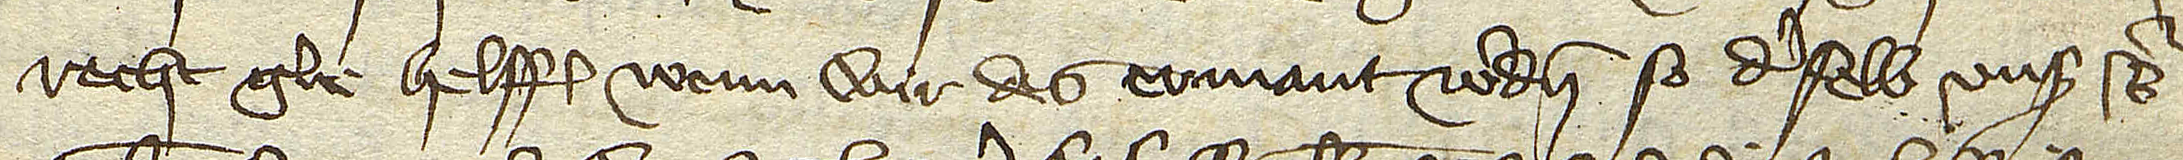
recht g*ne helff* wenn wir des ermant w*dn* ſo d*ſelb vnſ* B*
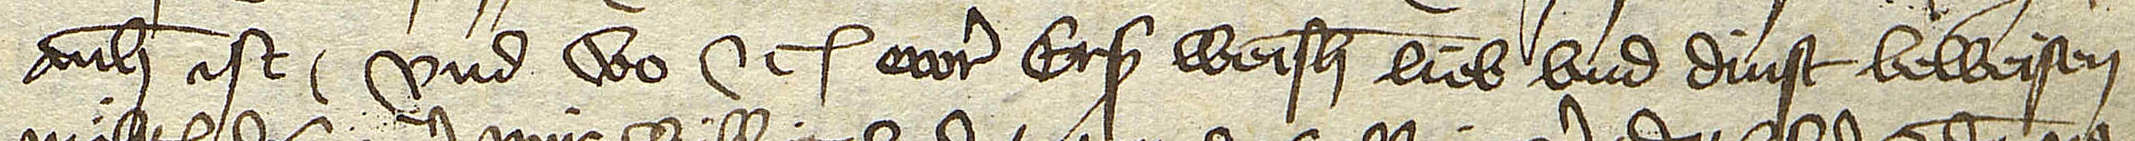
anh* iſt / vnd wo ec* ewr* Erſ* weiſh* lieb vnd dinſt beweiſen
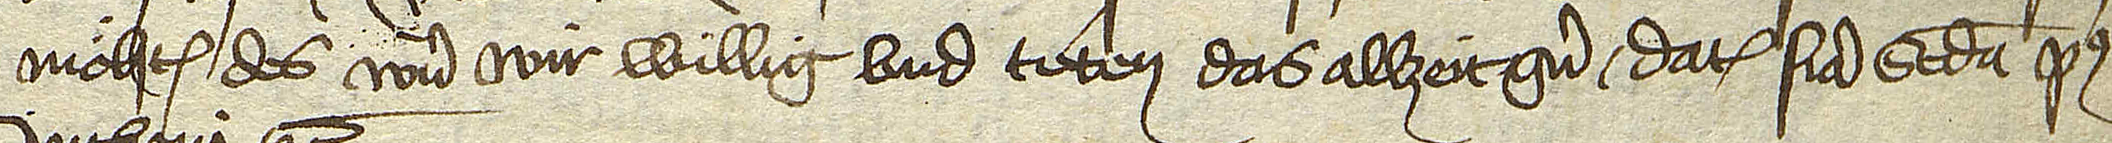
möht* des wn* wir willig vnd teten das allcʒeit gn* / dat* fia* Stda* p*
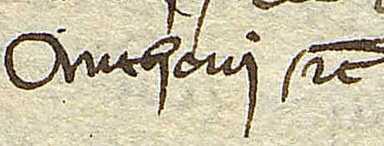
Anthoni ec*
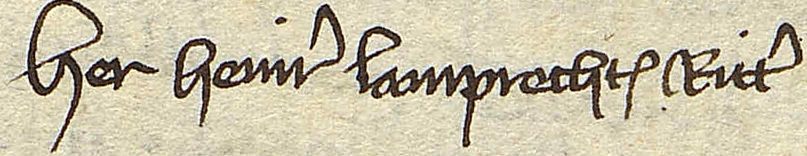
Her heinr* lamprecht* Ritt*
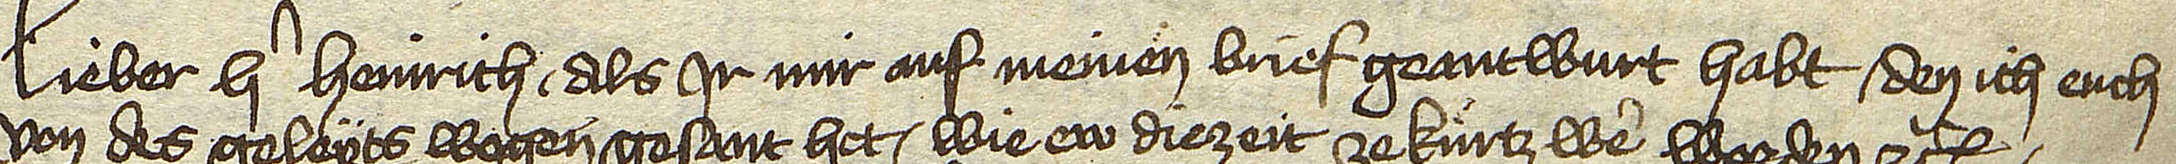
Lieber h* heinrich / Als Ir mir auf meinen brief geantwurt habt / den ich euch
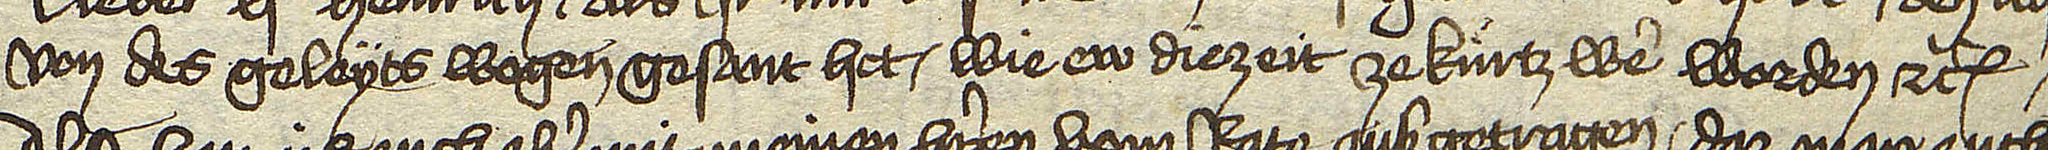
von des geleyts wegen geſant het / wie ew dieʒeit cʒekürtʒ we* worden ec* /
